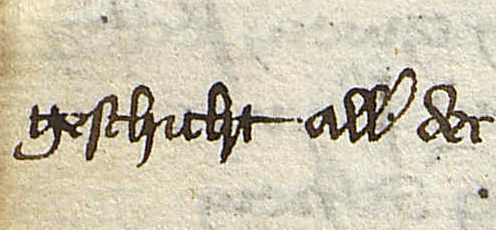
geſchicht all* der
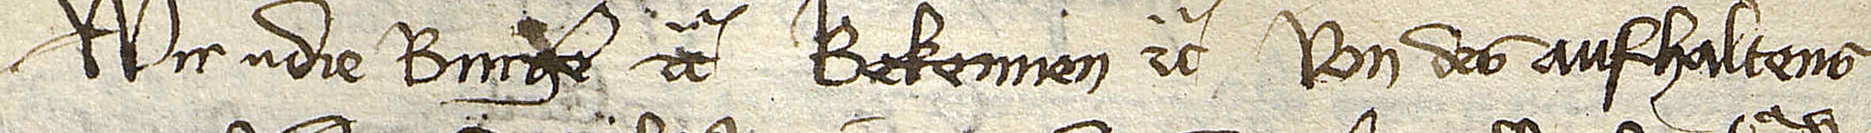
Wir ~ die Burge* ec* Bekennen ec* / Von des aufhaltens
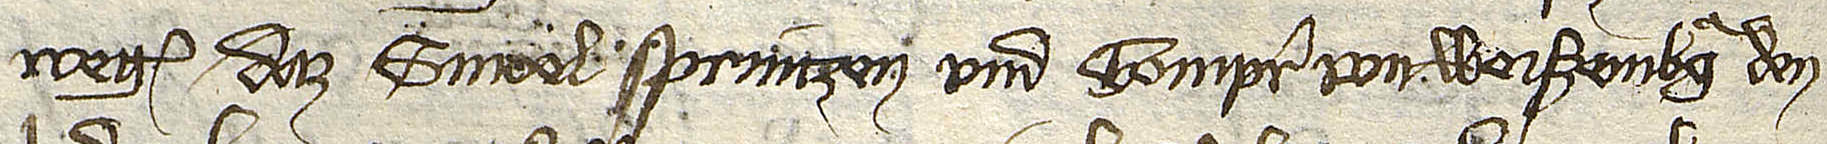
weg* / daʒ Smoel ſprincʒen vnd Gompr* von Weiſʒemb*g den
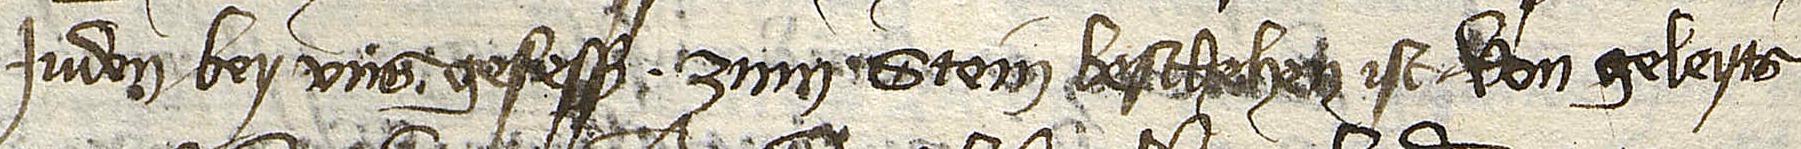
Iuden bey vns geſeſſ* ʒum Stein beſchehn iſt / von geleyts
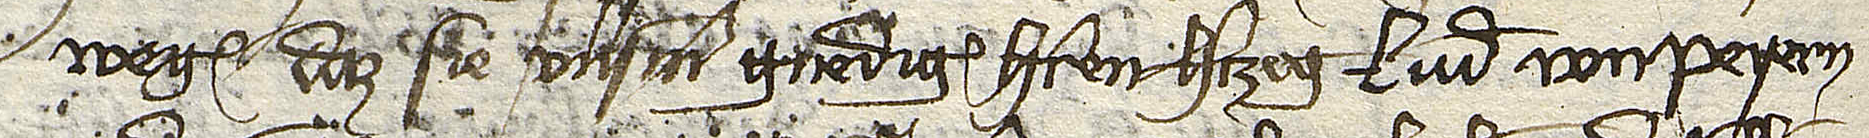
weg* / daʒ ſie vnſm* gnedig* h*ren h*cʒog Lud* von Peyern
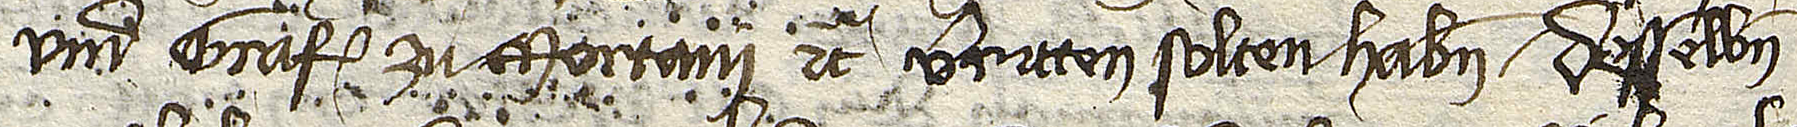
vnd Graf* ʒu Mortani ec* v*ritten ſolten habn* / Deſſelbn*
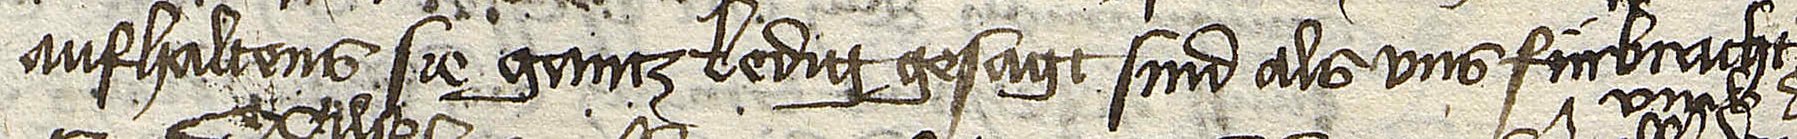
aufhaltens ſie gancʒ ledig geſagt ſind als vns fürbracht
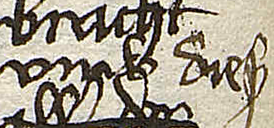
vmb dieſ*
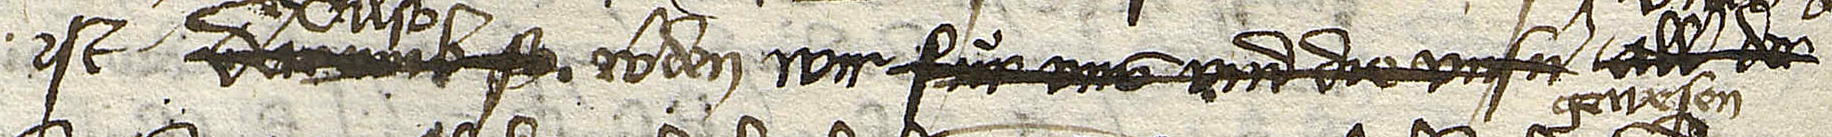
iſt / Darumb ſo w*den wir für vns vnd die vnſn* / all* der
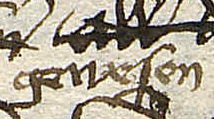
geweſen
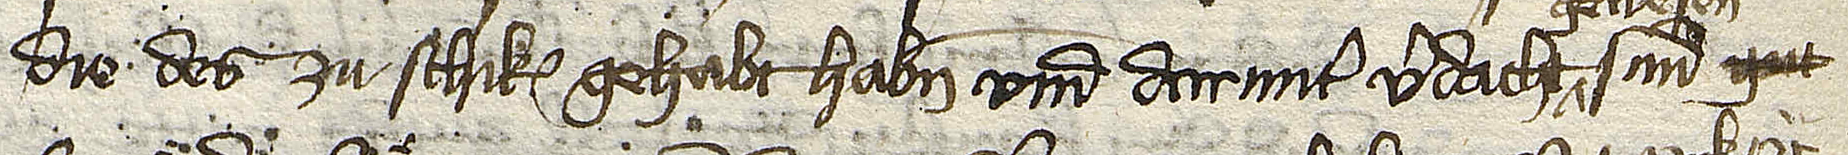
die des ʒu ſchik* gehabt habn* vnd darunt* v*dacht ſind gut
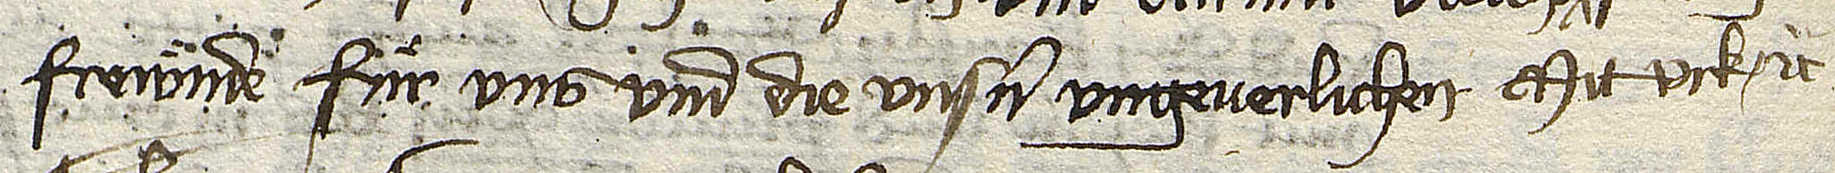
freẅnde / für vns vnd die vnſn* vngeuerlichen . Mit vrk* ec*
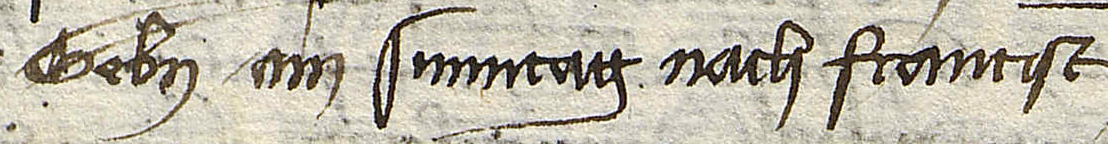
Gebn* / am ſunntag nach franciſci
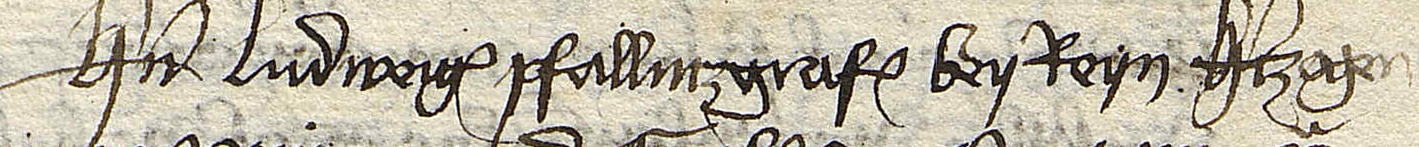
Hn* Ludweig* pfallncʒgraf* bey Reyn H*cʒogen
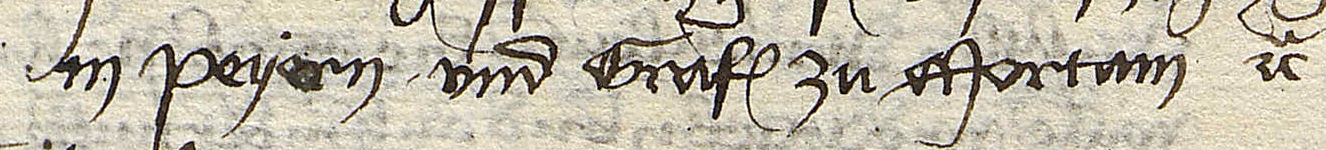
in Peyern vnd Graf* ʒu Mortani ec*
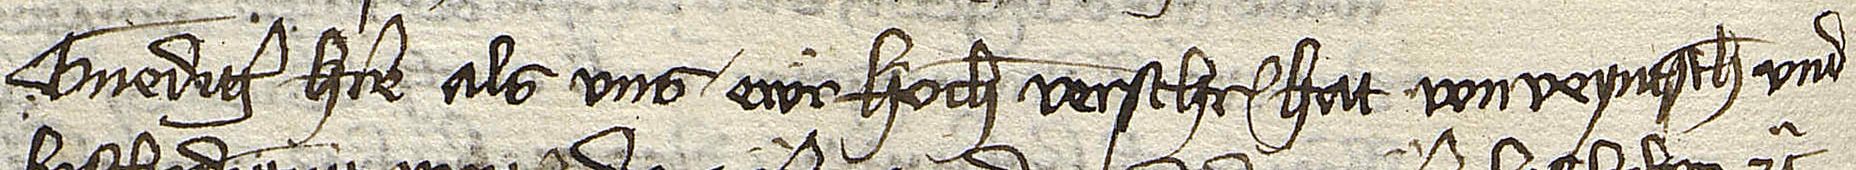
Gnedig* h*re als vns / eẅr Hoch* verſchr* hat von veyntſch* vnd
